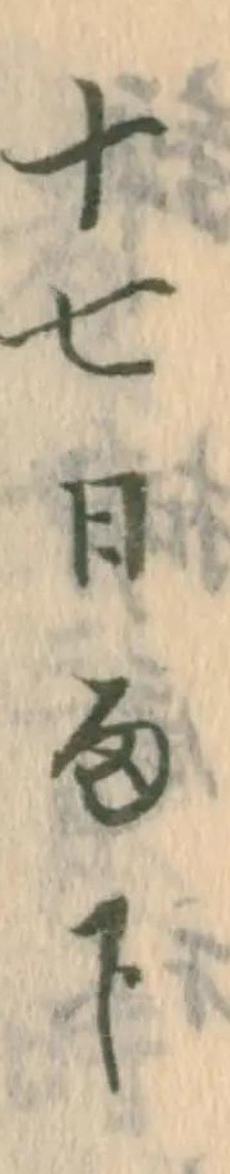十七日雨下
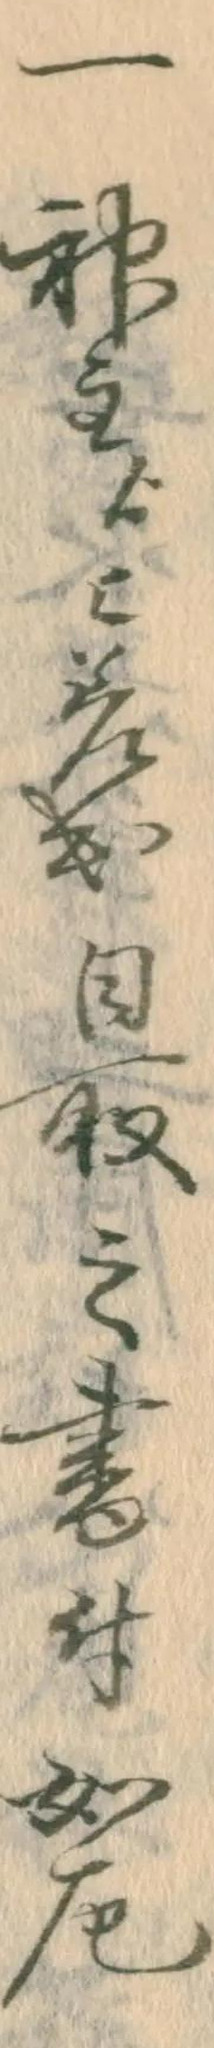一神主ゟ被差出日取之書付如左
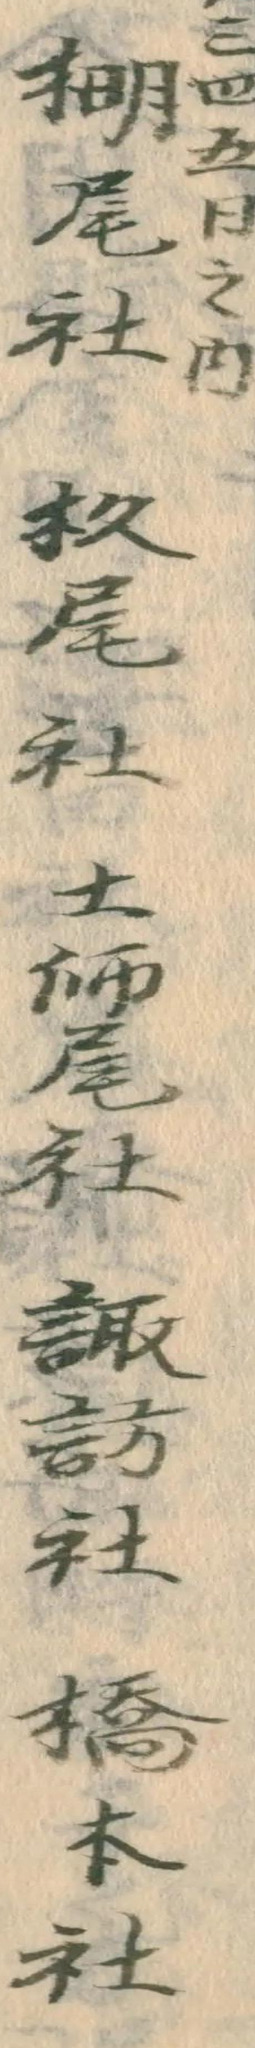棚尾社杦尾社土師尾社諏訪社橋本社
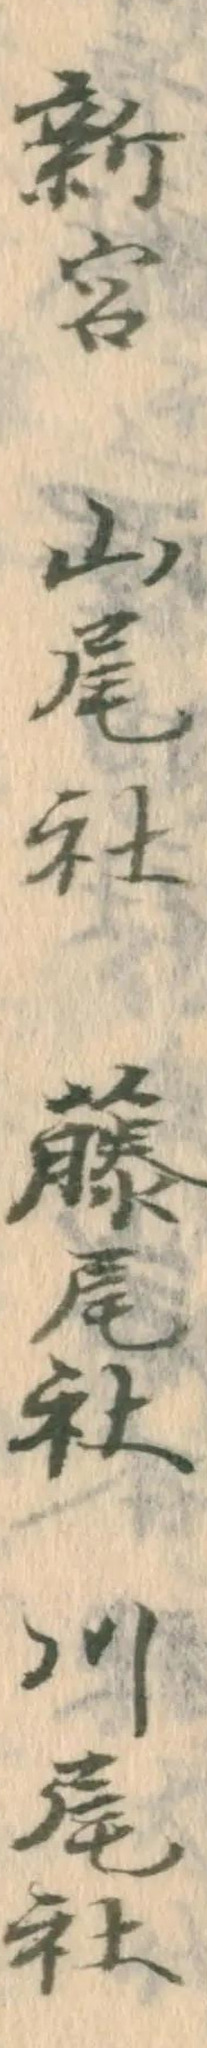新宮山尾社藤尾社川尾社
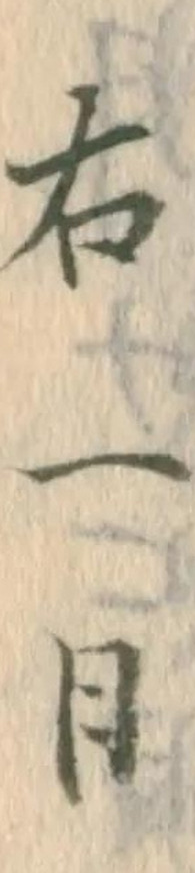右一日
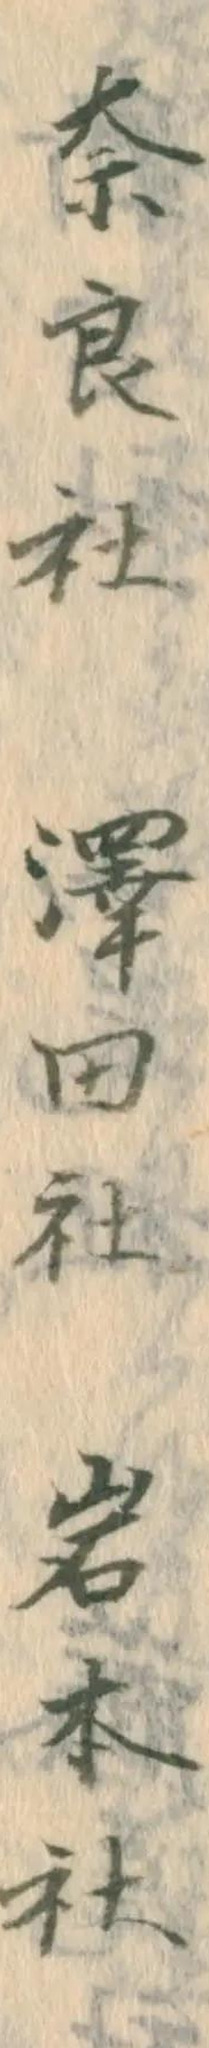奈良社澤田社岩本社
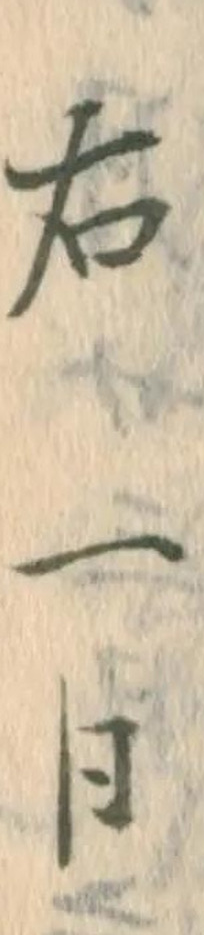右一日
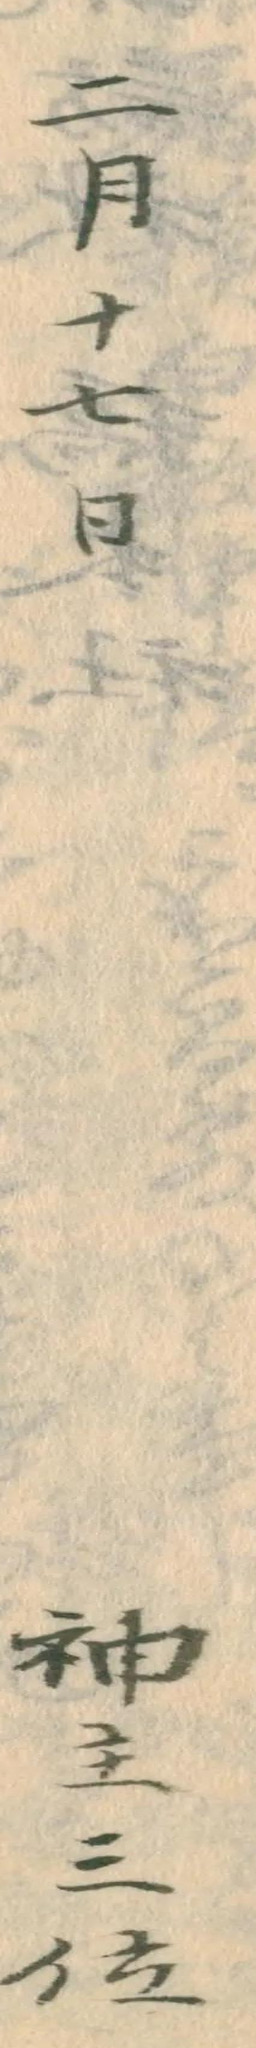二月十七日神主三位
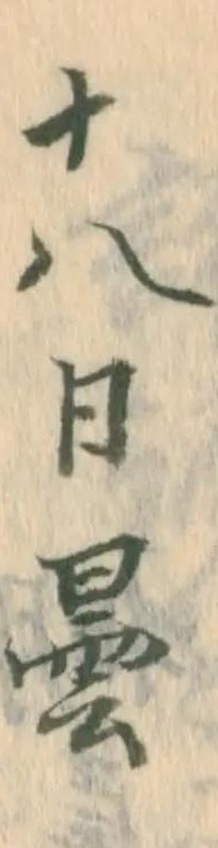十八日曇
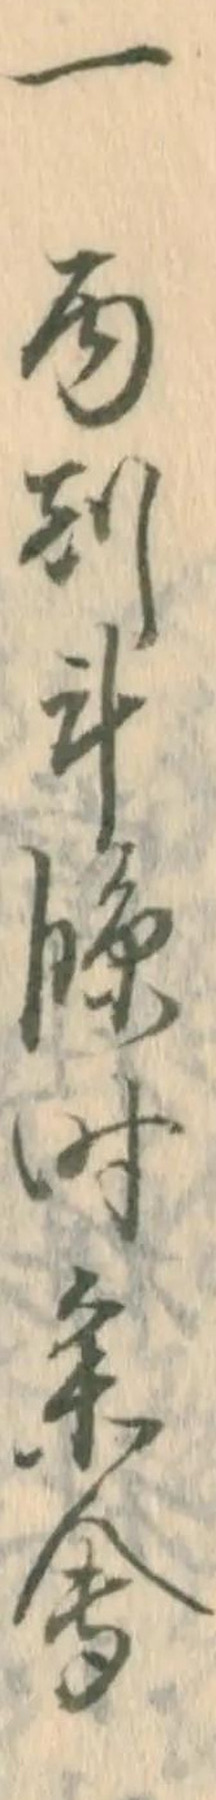一酉刻計臨時参会
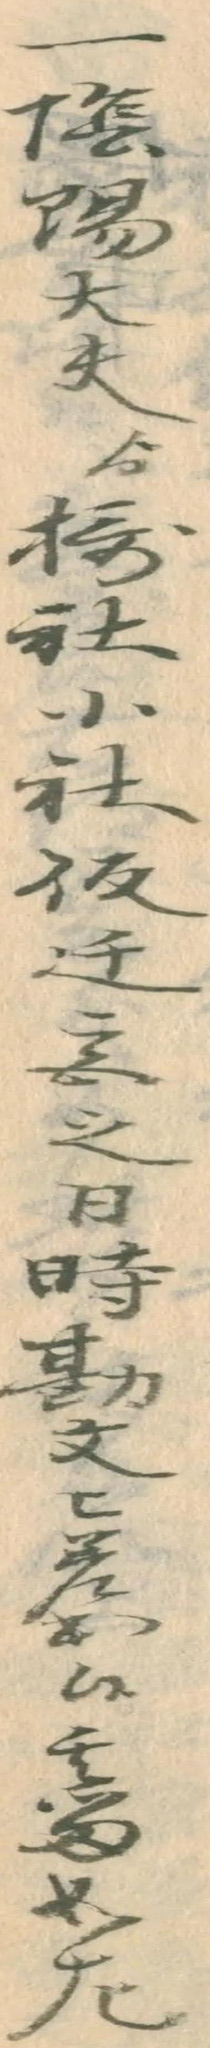一陰陽大夫ゟ摂社小社仮迁宮之日時勘文被差出候其留如左

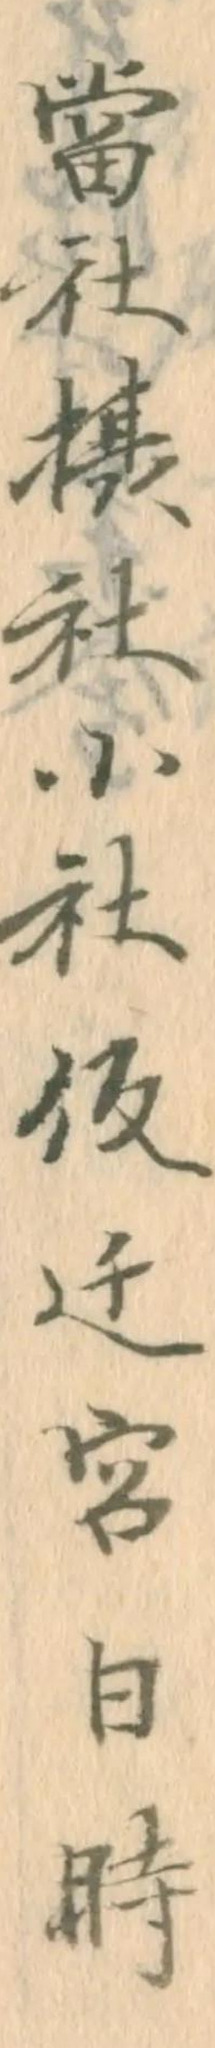当社摂社小社仮辻宮日時
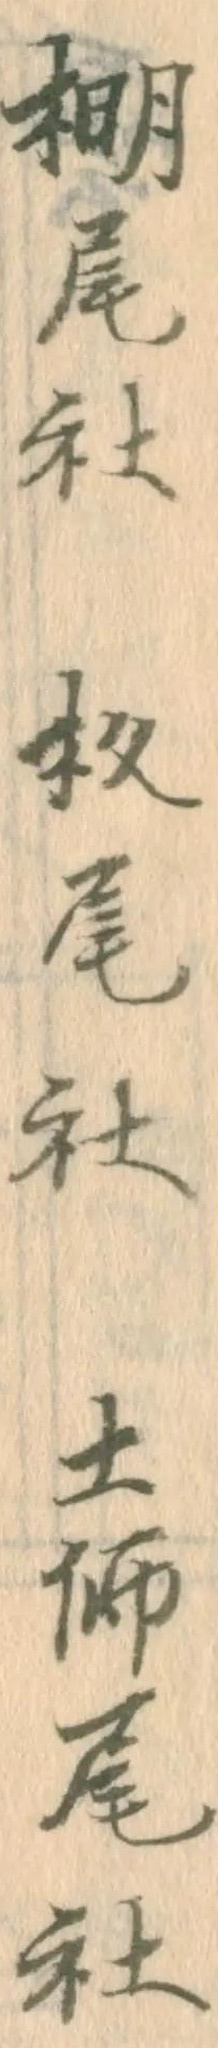棚尾社杦尾社土師尾社
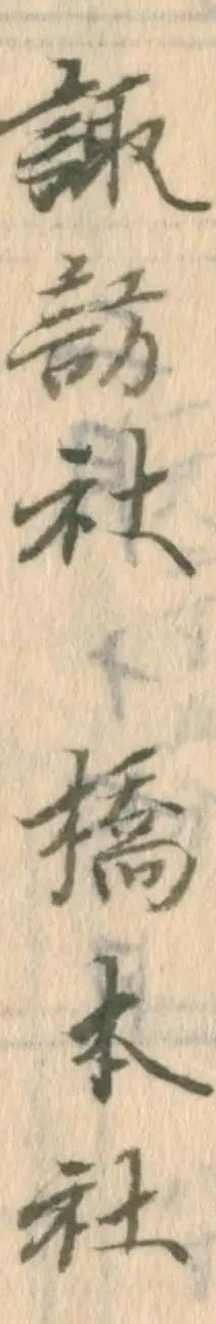諏訪社橋本社
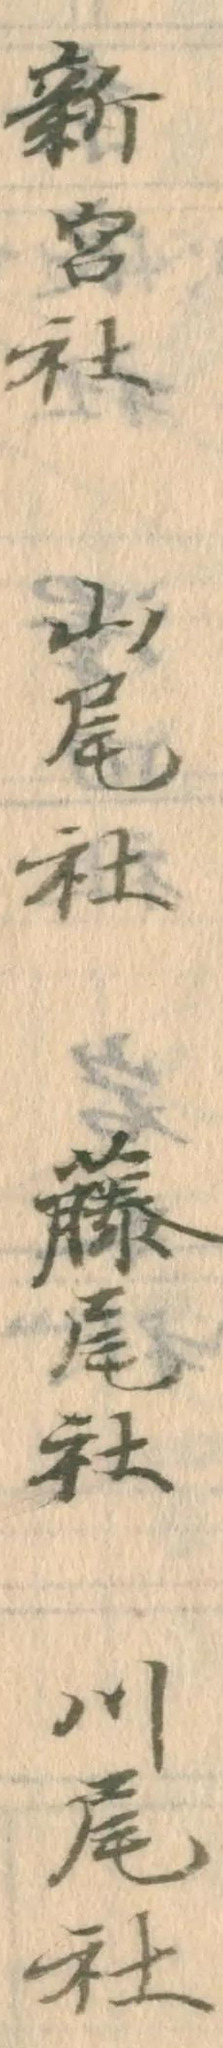新宮社山尾社藤尾社川尾社
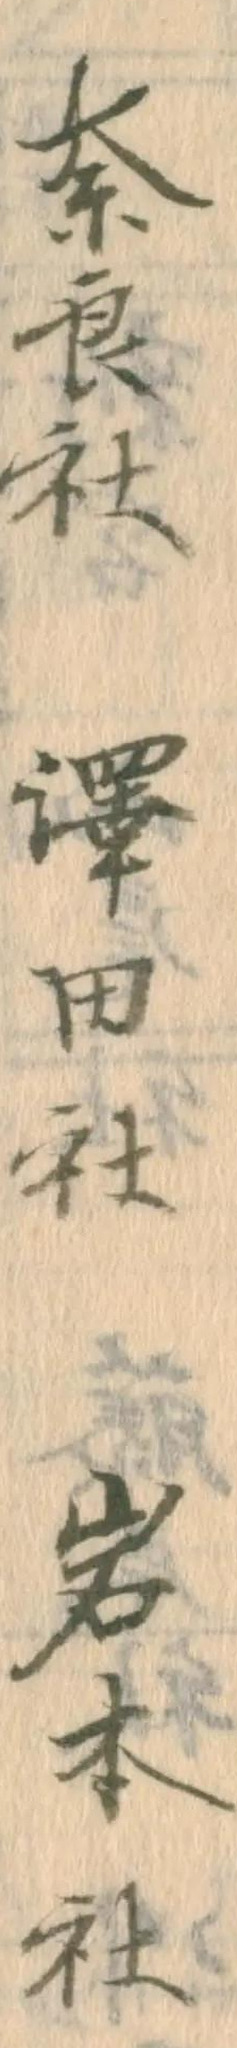奈良社沢田社岩本社
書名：賀茂社記録. 第17冊
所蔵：国立国会図書館 National Diet Library, JAPAN
